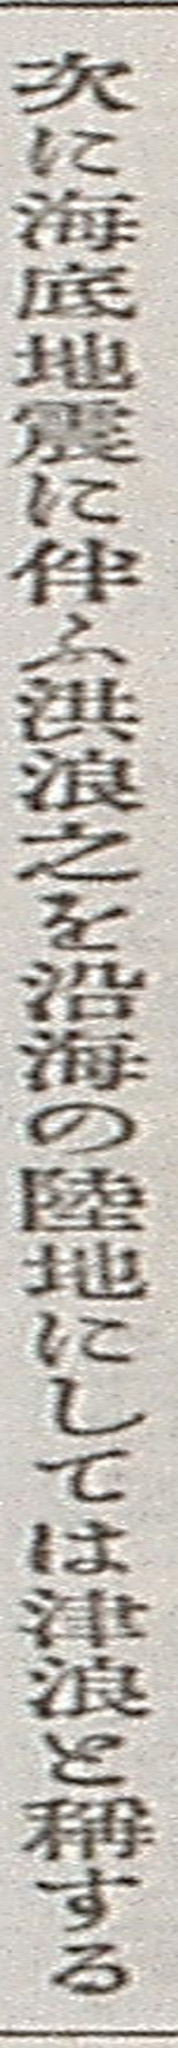次に海底地震に伴ふ洪波之を沿海の陸地にしては津浪と称する
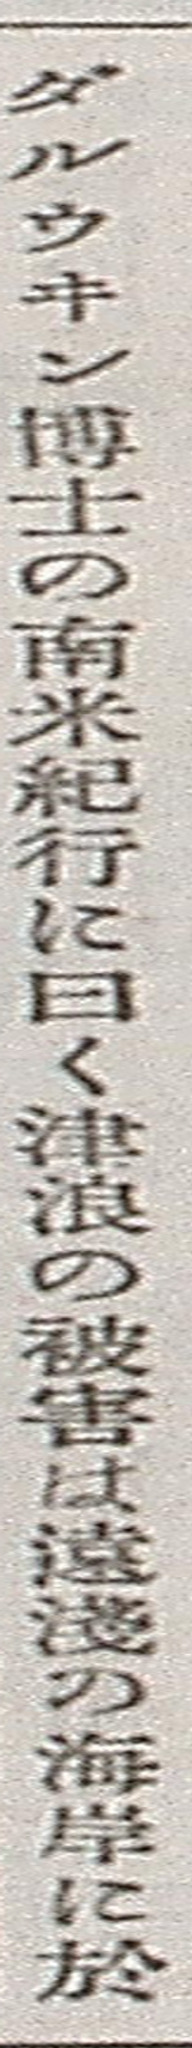ダルウヰン博士の南米紀行に曰く津浪の被害は遠浅の海岸に於
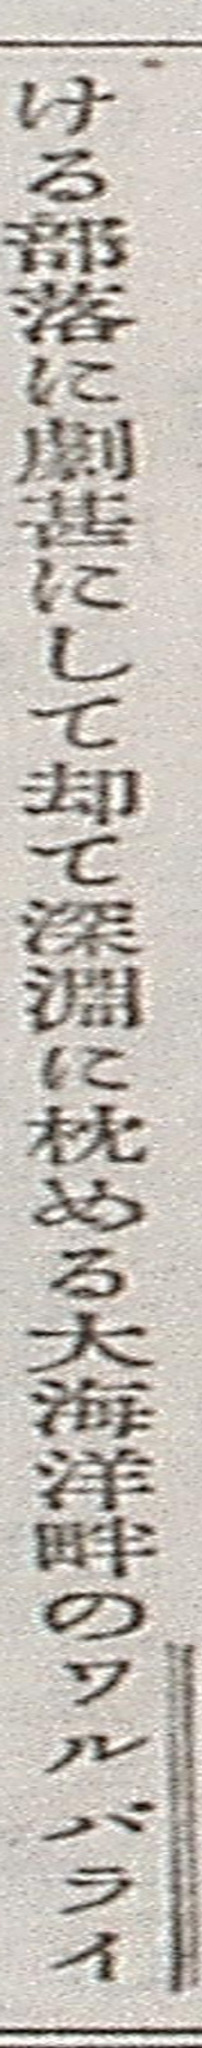ける部落に劇甚にして却て深淵に枕める大海洋畔のワルパライ
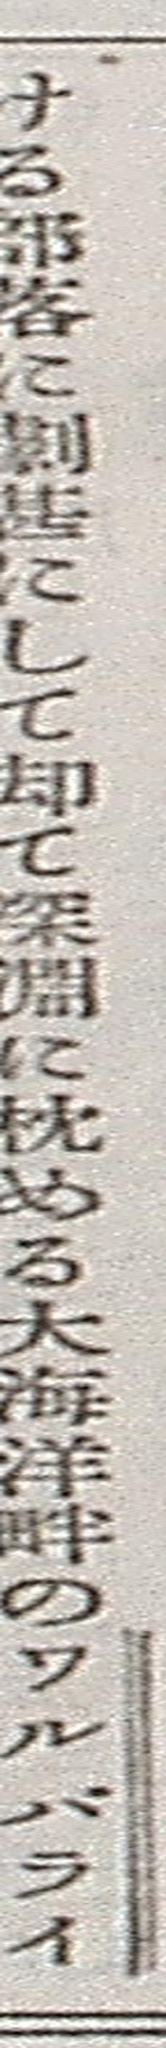ける部落に劇甚にして却て深淵に枕める大海洋畔のワルパライ
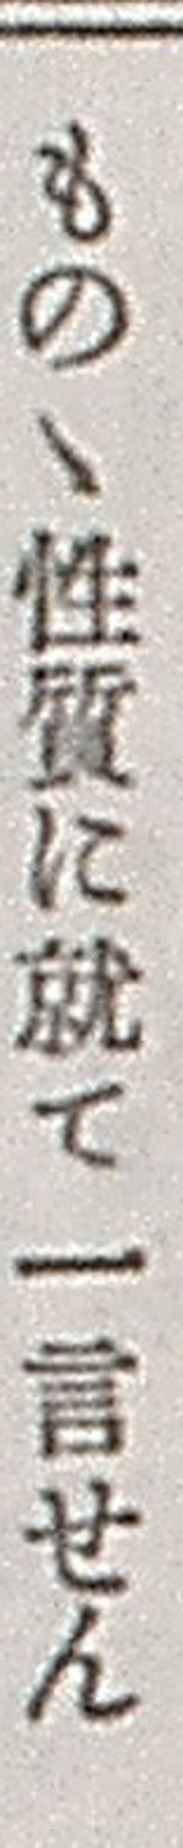ものゝ性質に就て一言せん
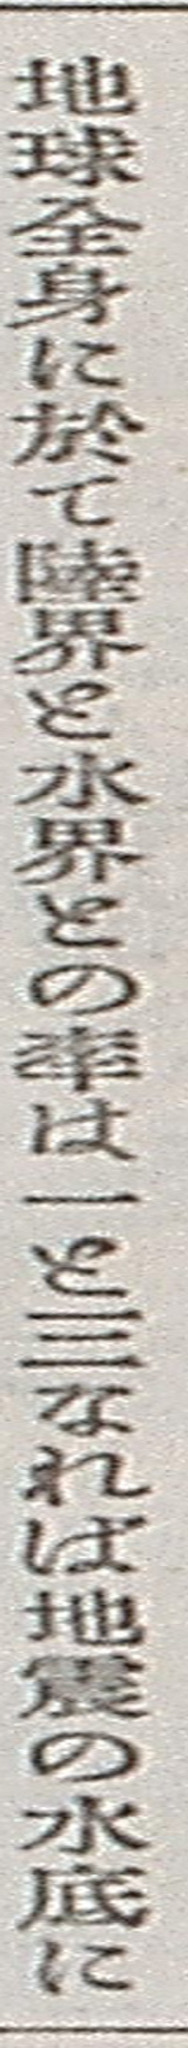地球全身に於て陸界と水界との率は一と三なれば地震の水底に
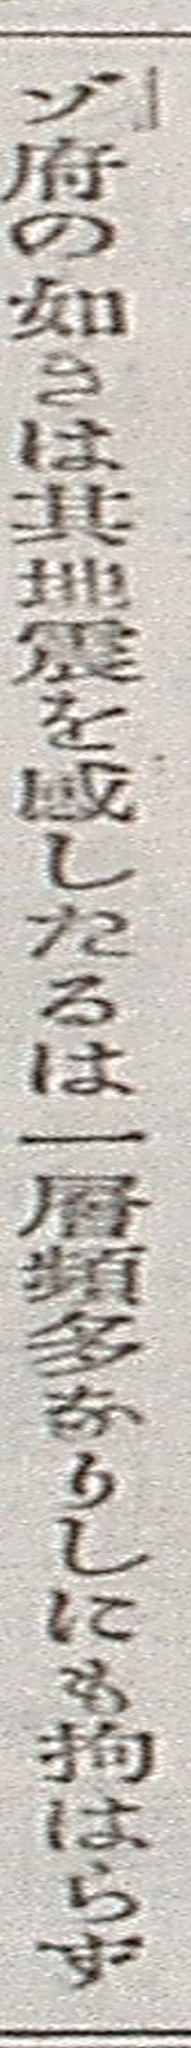ゾ府の如きは其地震を感したるは一層頻多なりしにも拘はらず
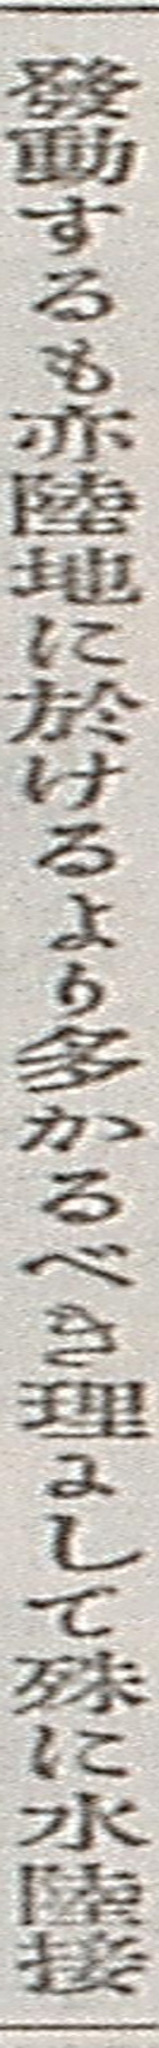発動するも亦陸地に於けるより多かるべき理にして殊に水陸接
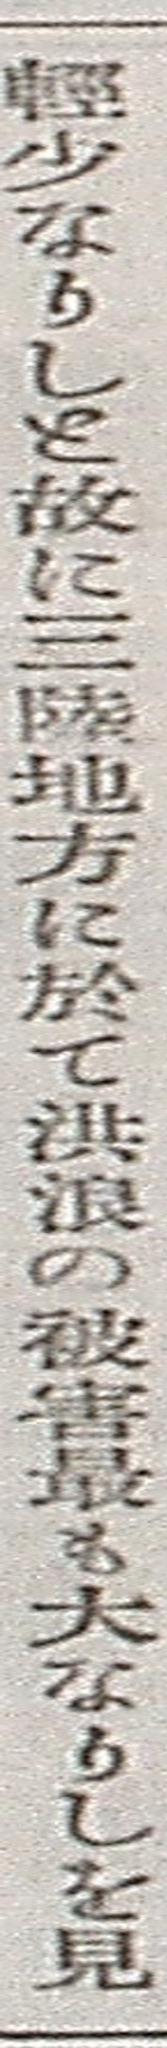軽少なりしと故に三陸地方に於て洪浪の被害最も大なりしを見
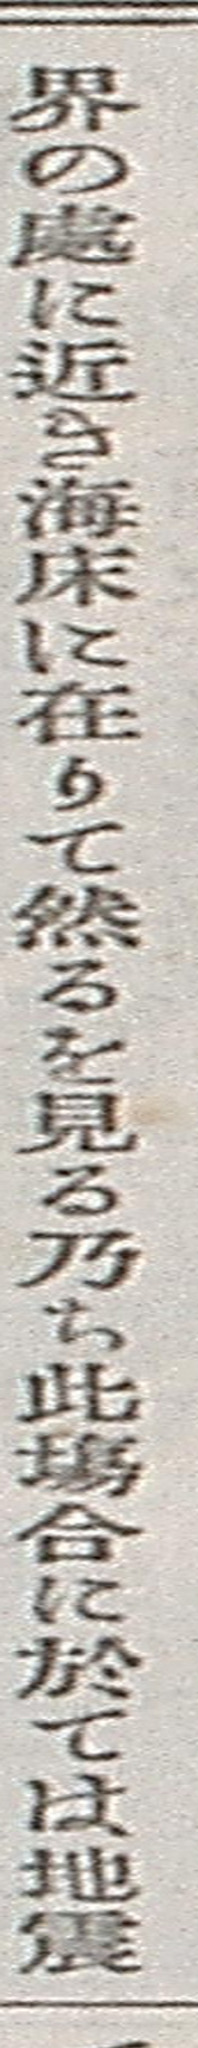界の処に近き海床に在りて然るを見る乃ち此場合に於ては地震
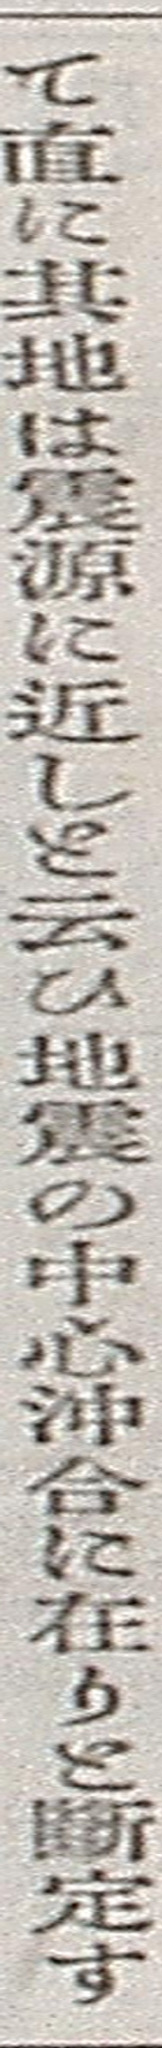て直に其地は震源に近しと云ひ地震の中心沖合に在りと断定す
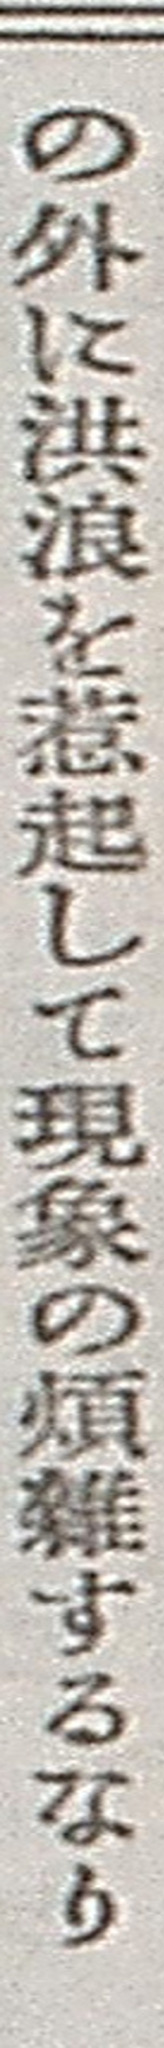の外に洪浪を惹起して現象の煩雑するなり
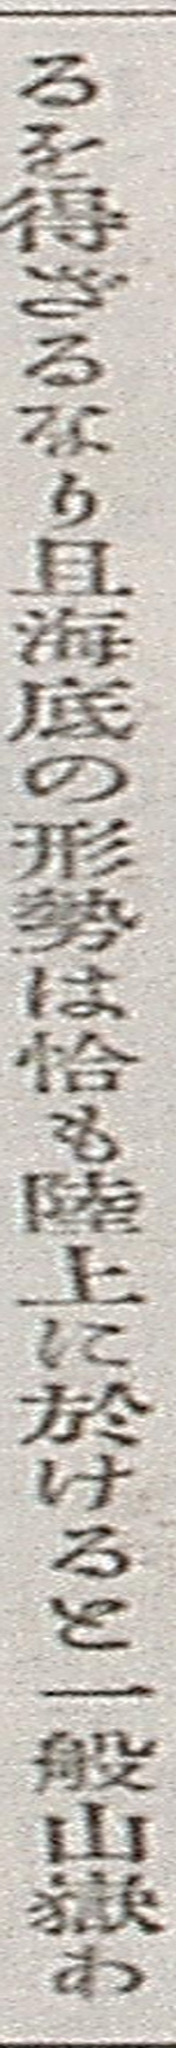るを得ざるなり且海底の形勢は恰も陸上に於けると一般山嶽あ
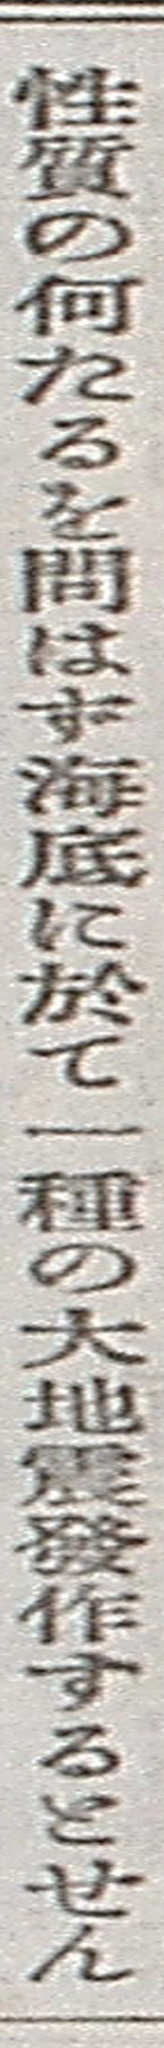性質の何たるを問はず海底に於て一種の大地震発作するとせん
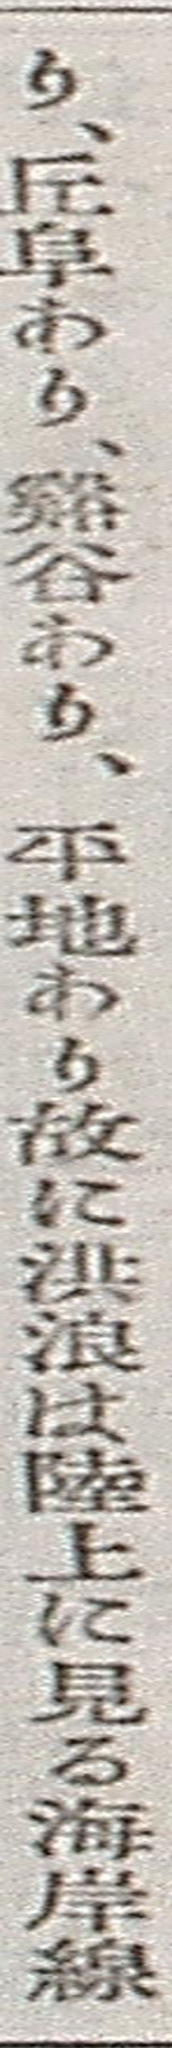り、丘阜あり、谿谷あり、平地あり故に洪浪は陸上に見る海岸線
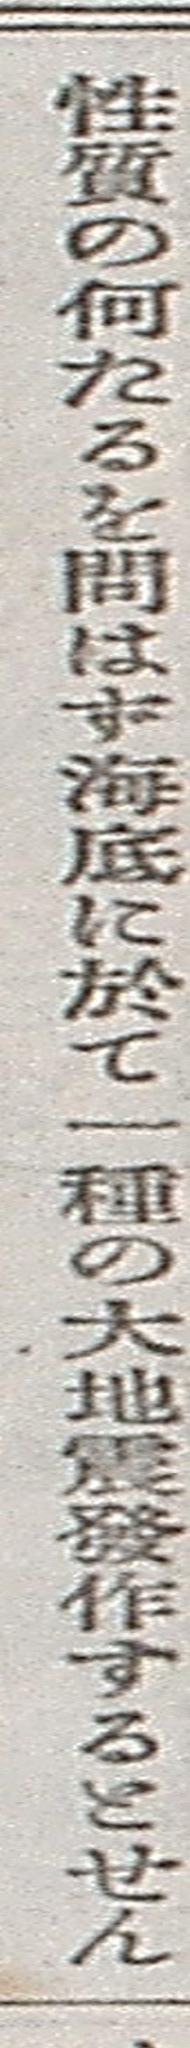性質の何たるを問はず海底に於て一種の大地震発作するとせん
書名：風俗畫報臨時増刊第百二十號　大海嘯被害録（下）
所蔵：東京大学地震研究所図書室 Earthquake Research Institute Library, The University of Tokyo, JAPAN
